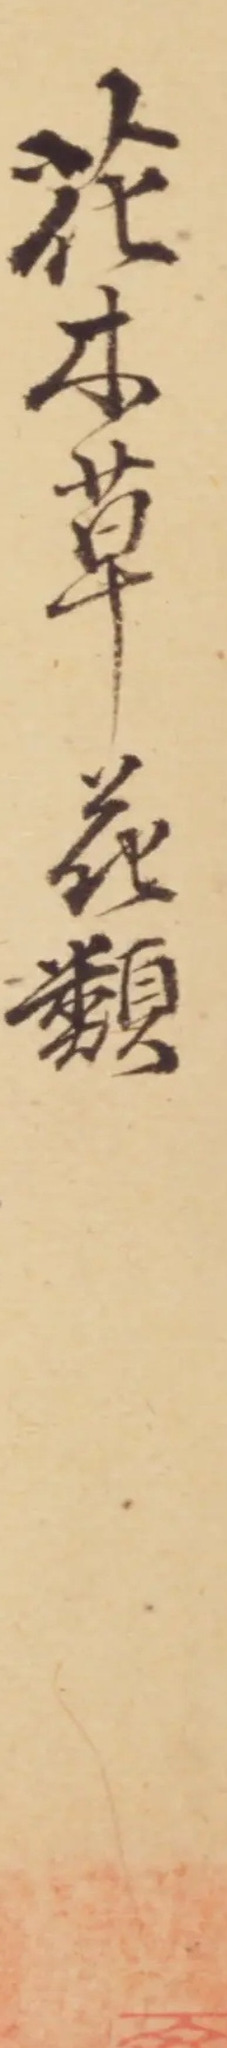花木草花類
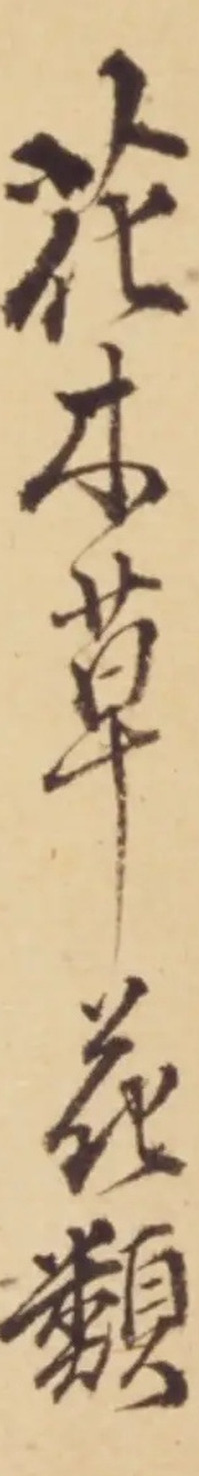花木草花類
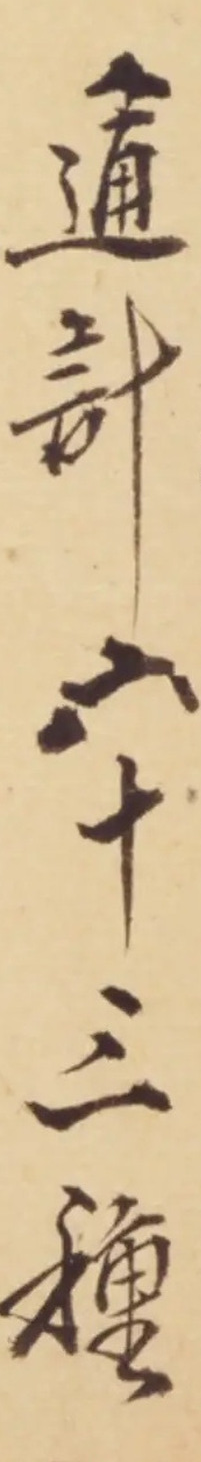通計五十三種
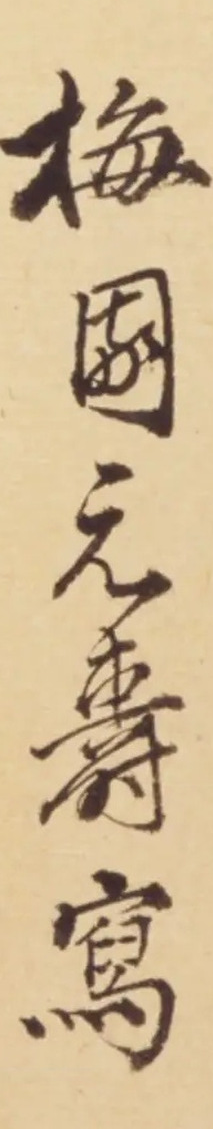梅園元寿写
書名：梅園草木花譜夏之部. 4
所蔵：国立国会図書館 National Diet Library, JAPAN
